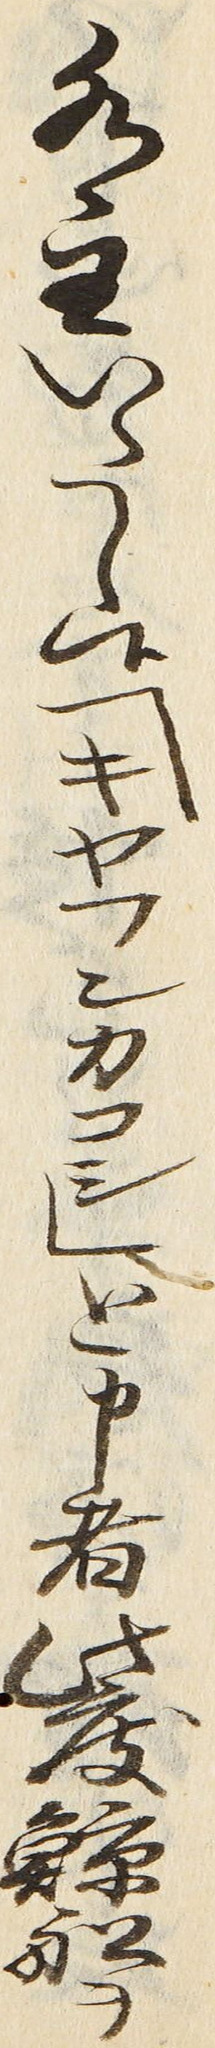水主いたし候「キヤフンカコシ」と申者此度鯨舩ヲ
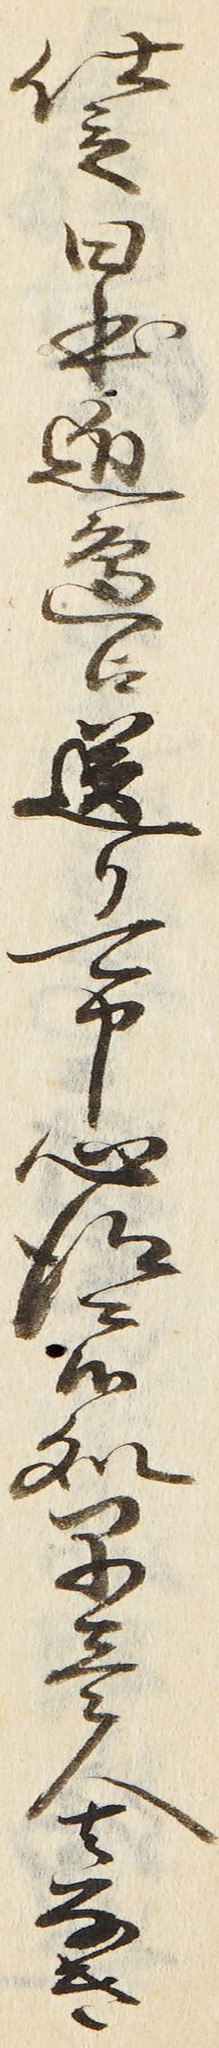仕立日本近邊江送り可申心得ニ候処早壱人者なき
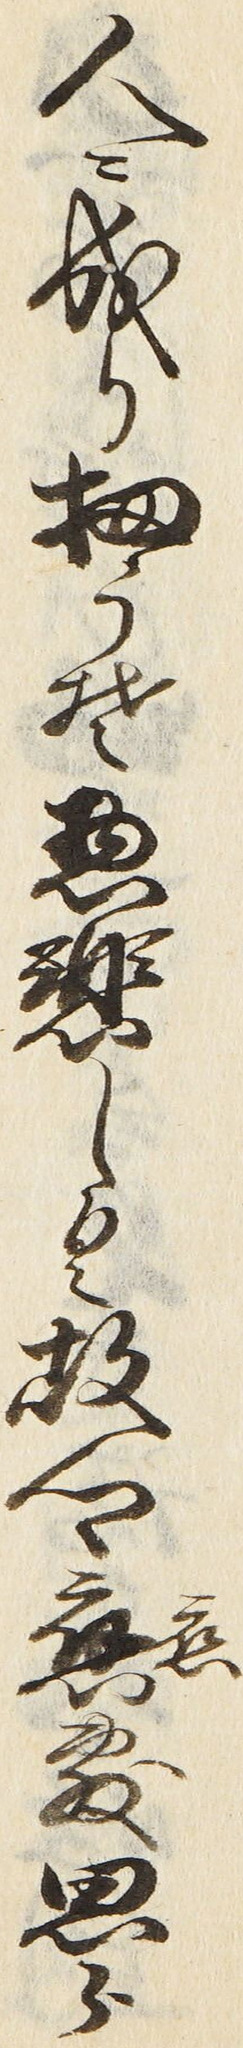人ニ成り扠こそ悪悲しく故郷恋敷思ら
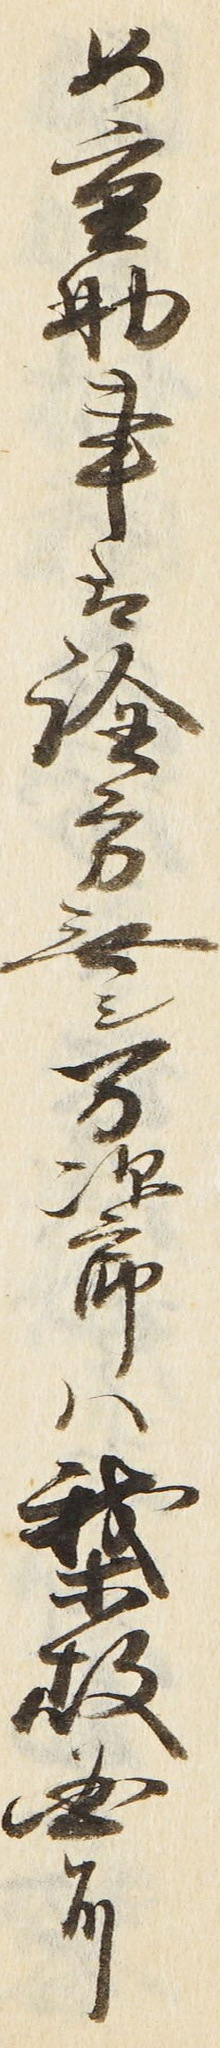め重助事は詮方無シ萬次郎ハ我等故国に
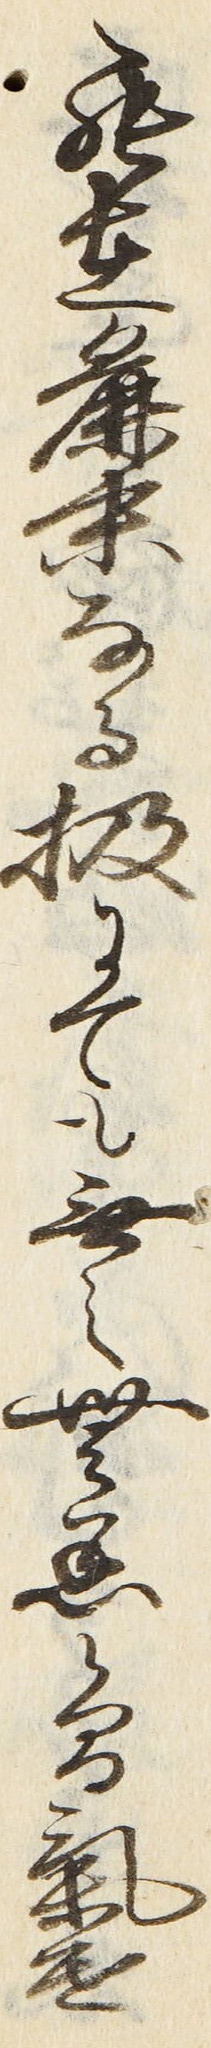罷在素末なる扱にても無之無恙之間氣遣
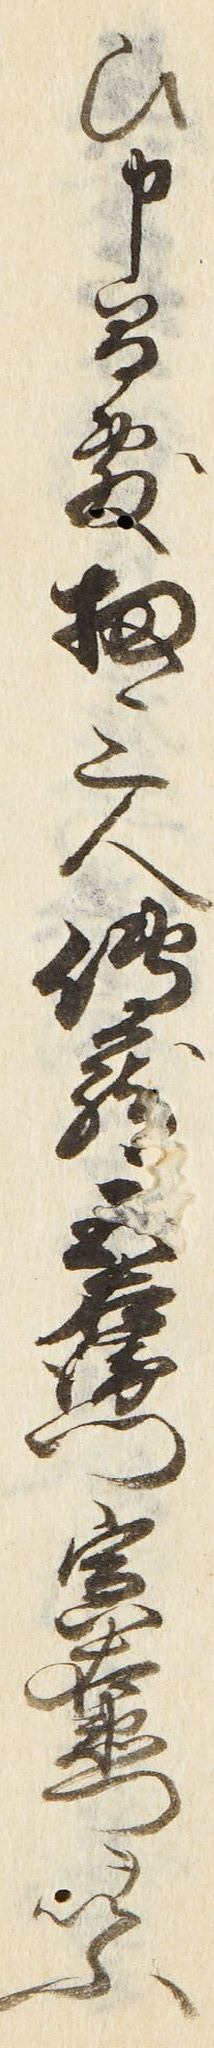ひ申間敷扠三人傳蔵五右衛門寅右衛門ヲいふ
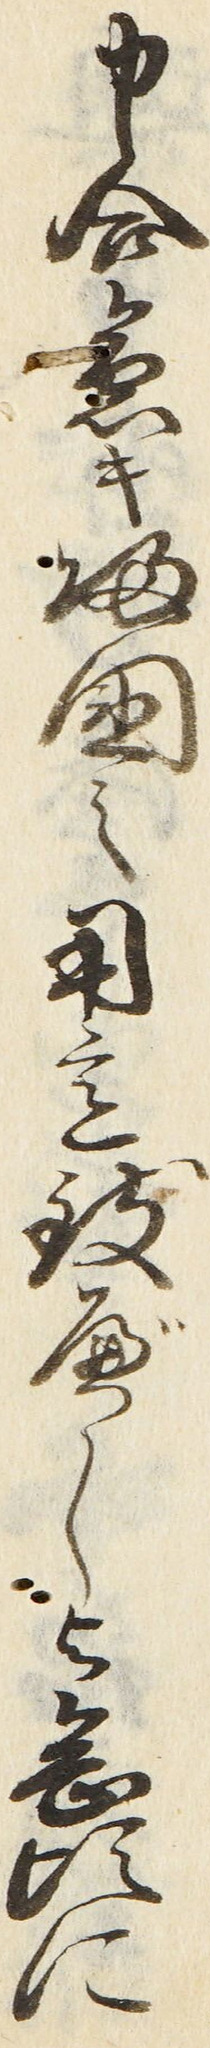申合急き帰国之用意致べしと念頃に
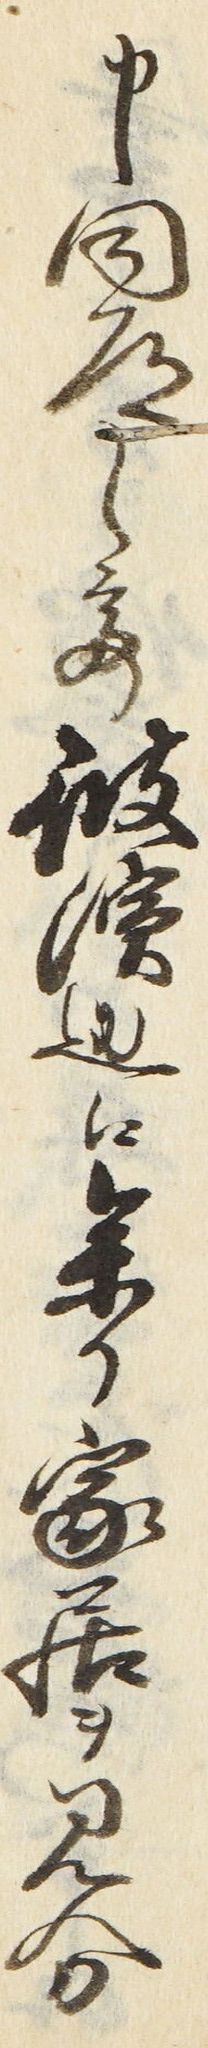申同道して彼濱辺江参り家居ヲ見分
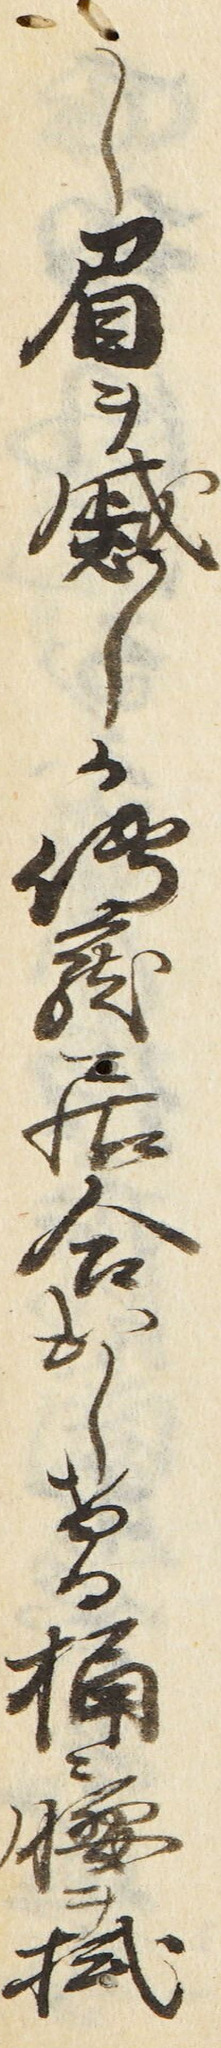し眉ヲ蹙しか傳蔵居合出しける桶ニ腰ヲ掛

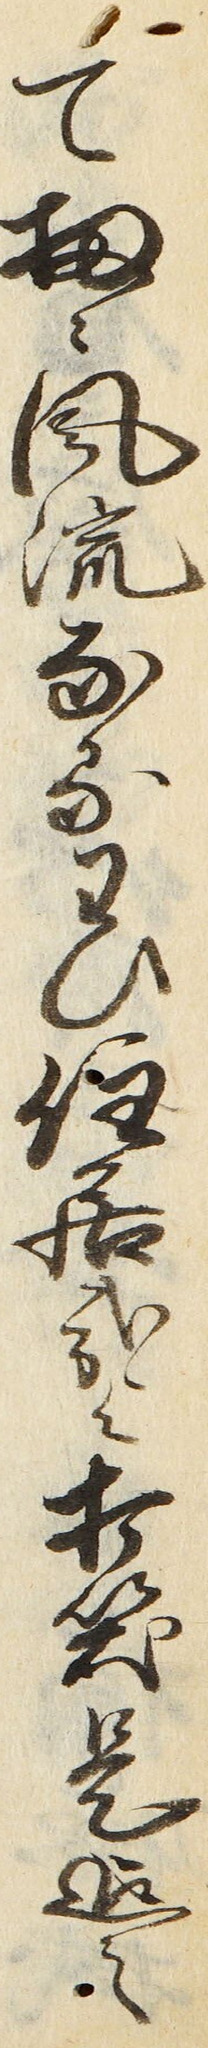て扠々風流なるわひ住居哉と打笑是迄之
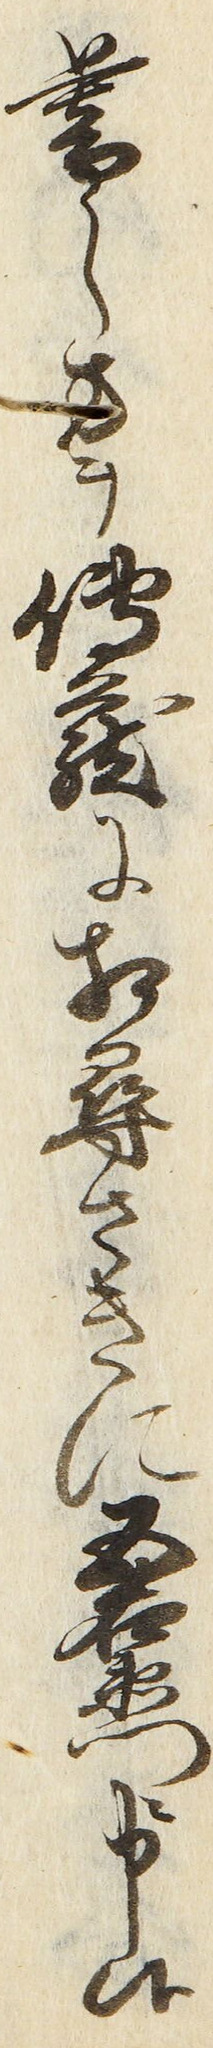暮し方ヲ傳蔵に相尋さきに五右衛門ニ申候
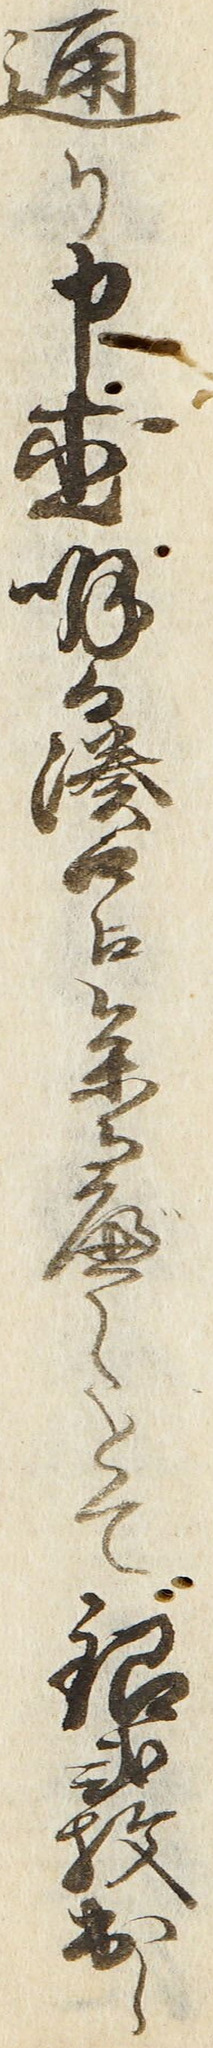通り申述明日湊口江参るへしとて銀弐枚出し
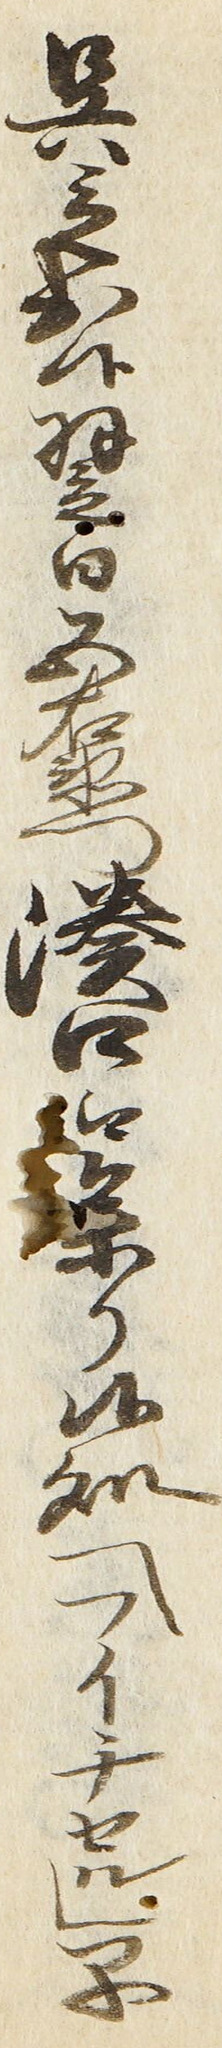呉立出候翌日五右衛門湊口江参り候処「フイチセル」早
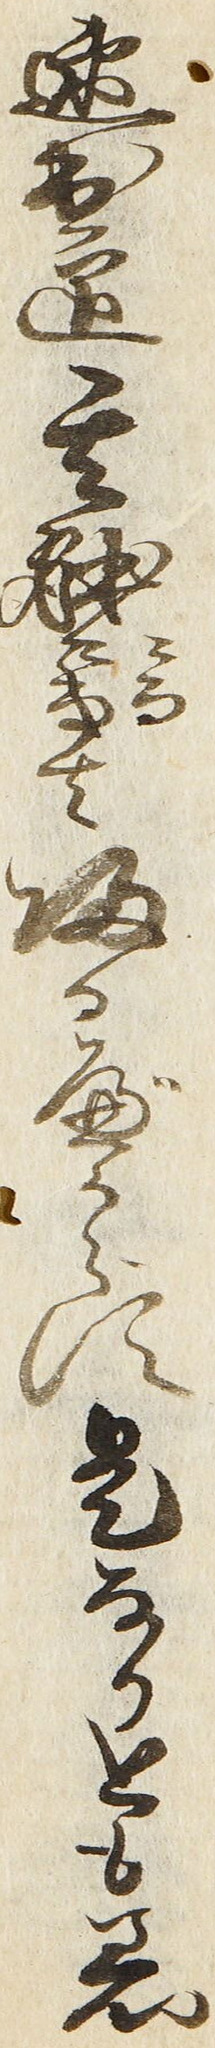速出迎其躰ニ而者帰るべからす是なりとも着
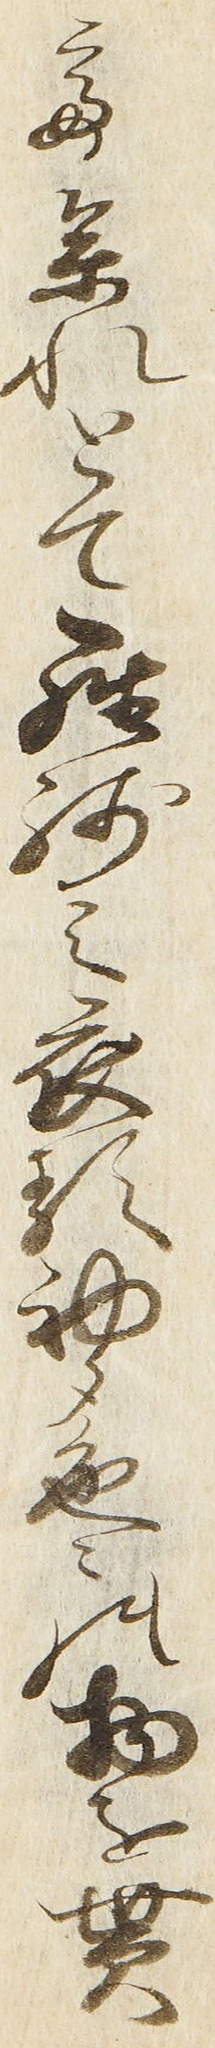て参れとて罷残之衣類初メ色々の物を貰
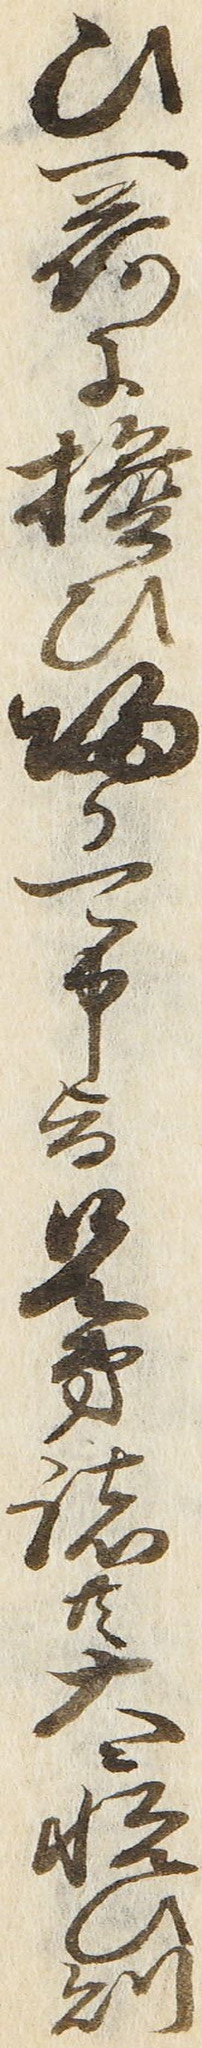ひ一荷に擔ひ帰り可申旨兄弟諸共大ニ悦ひ則
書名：漂客談寄
